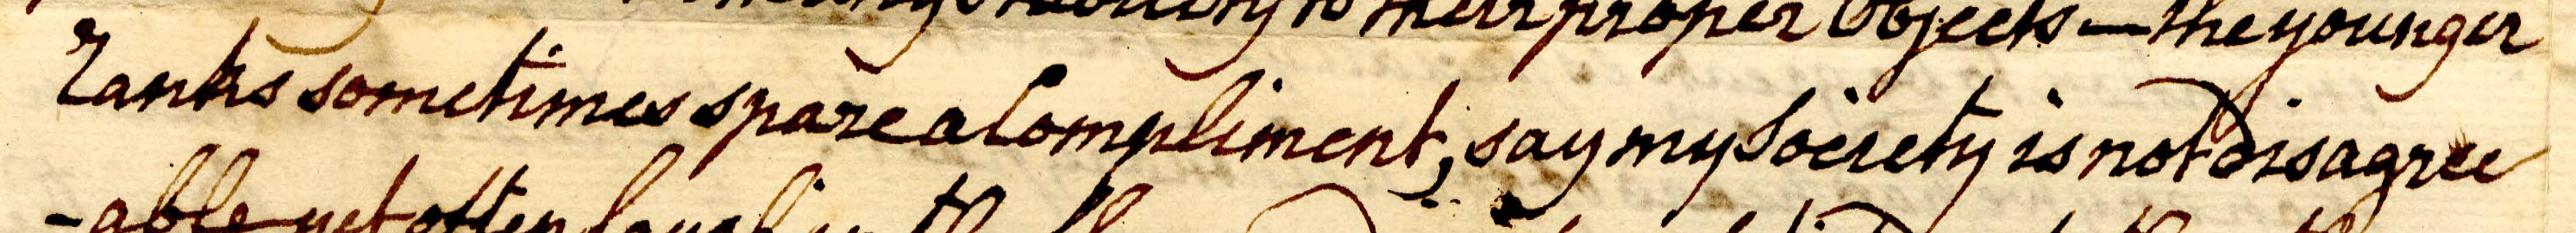ranks sometimes spare a Compliment, say my society is not disagree
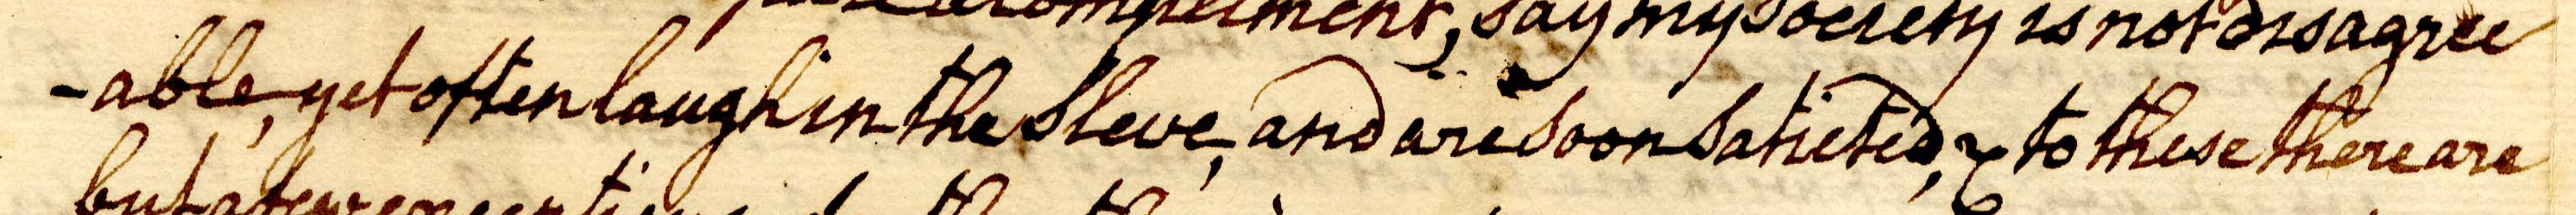-able, yet often laugh in the sleve, and are soon saticted, & to these there are
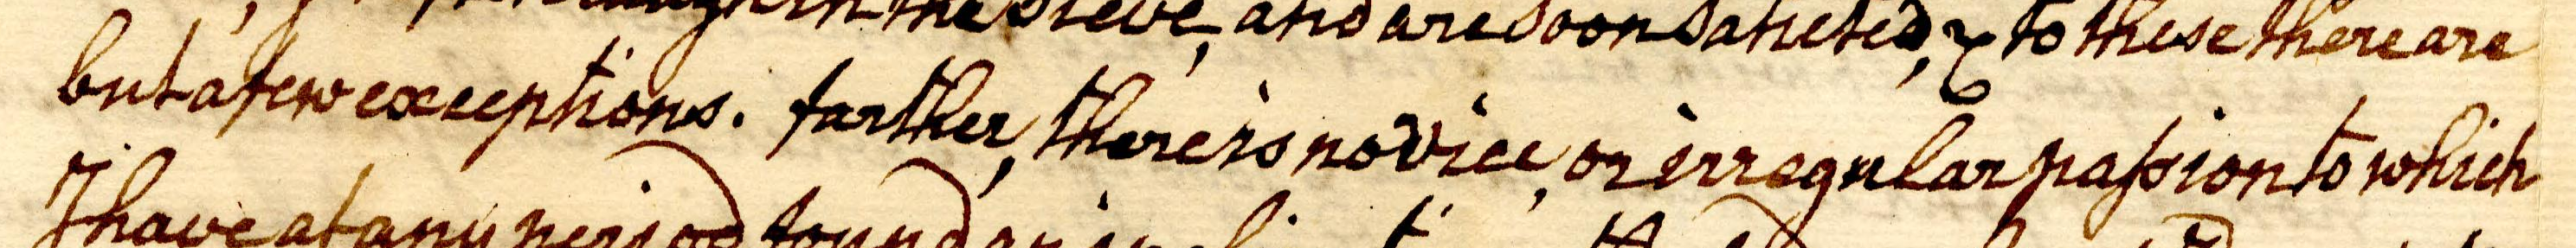but a few exceptions. farther, there is no vice, or irregular passion to which
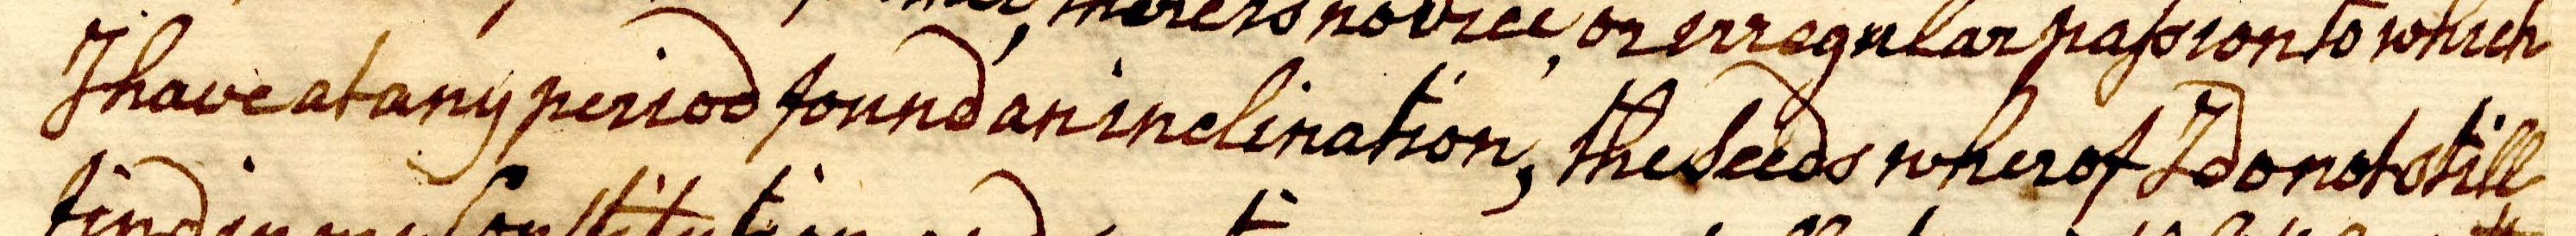I have at any period found an inclination, the seeds wherof I do not still
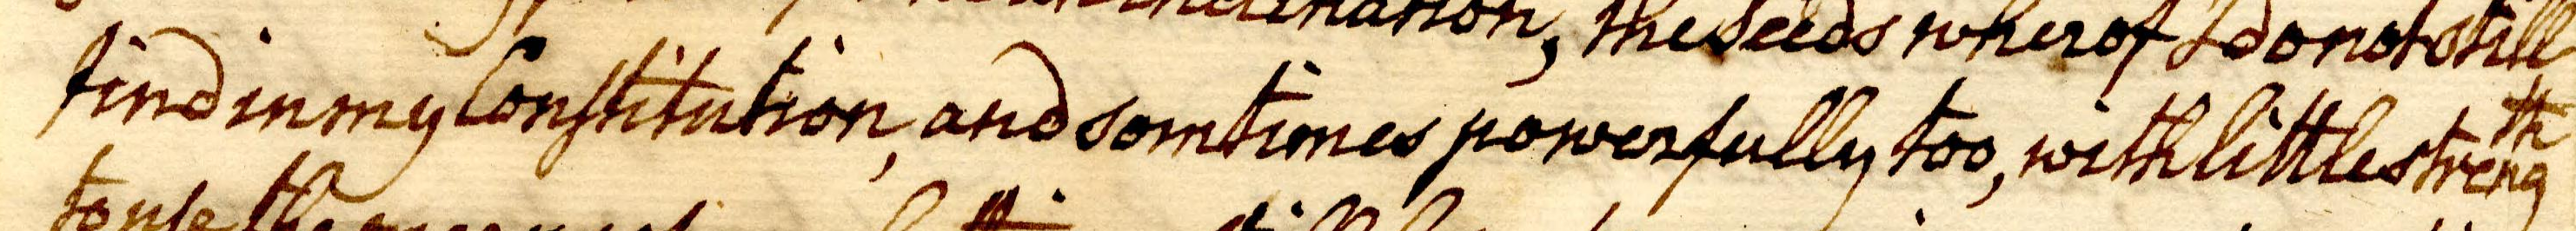find in my Constitution, and sometimes powerfully too, with little streng^th
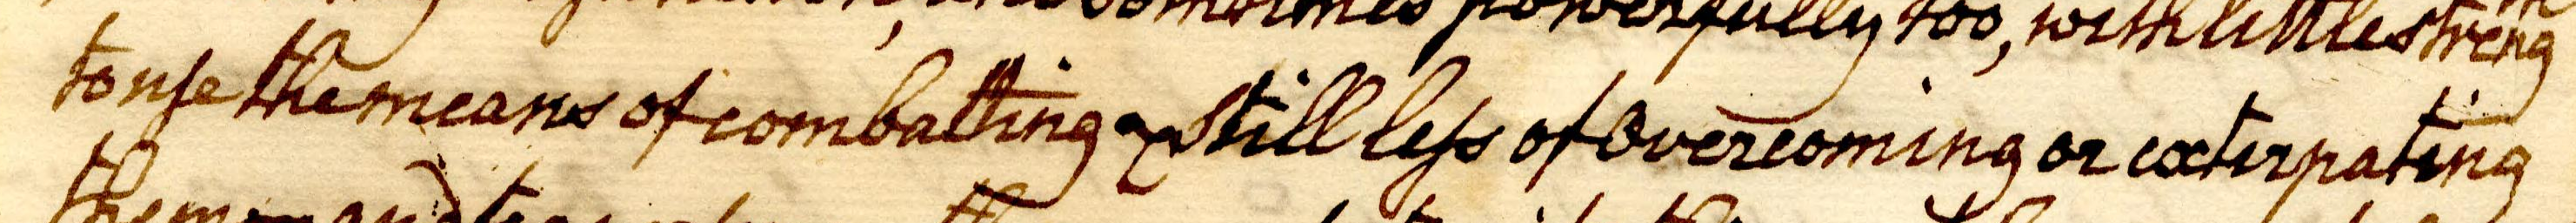to use the means of combatting & still less of Overcoming or exterpating
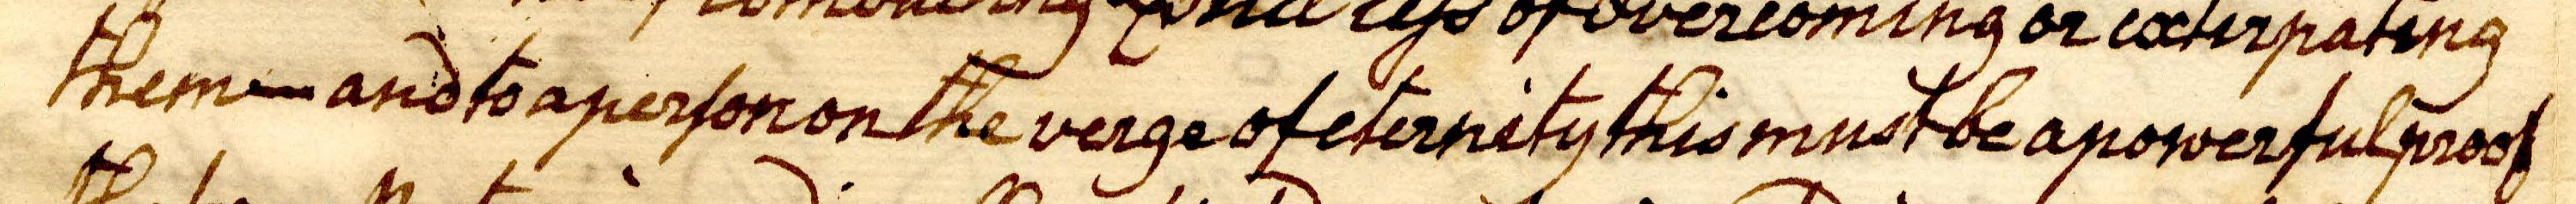them- and to a person on the verge of eternity this must be a powerful proof
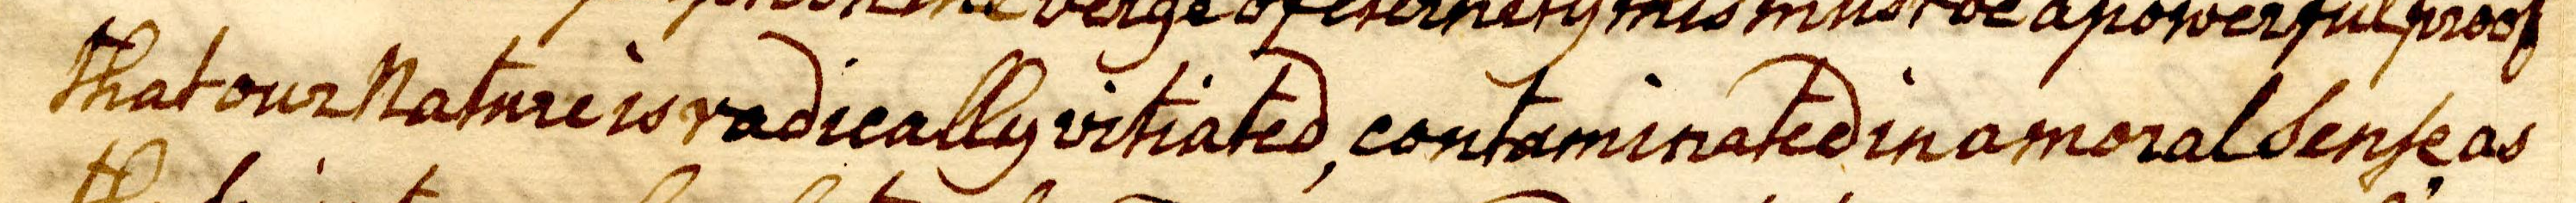that our Nature is radically vitiated, contaminated in a moral sense, as
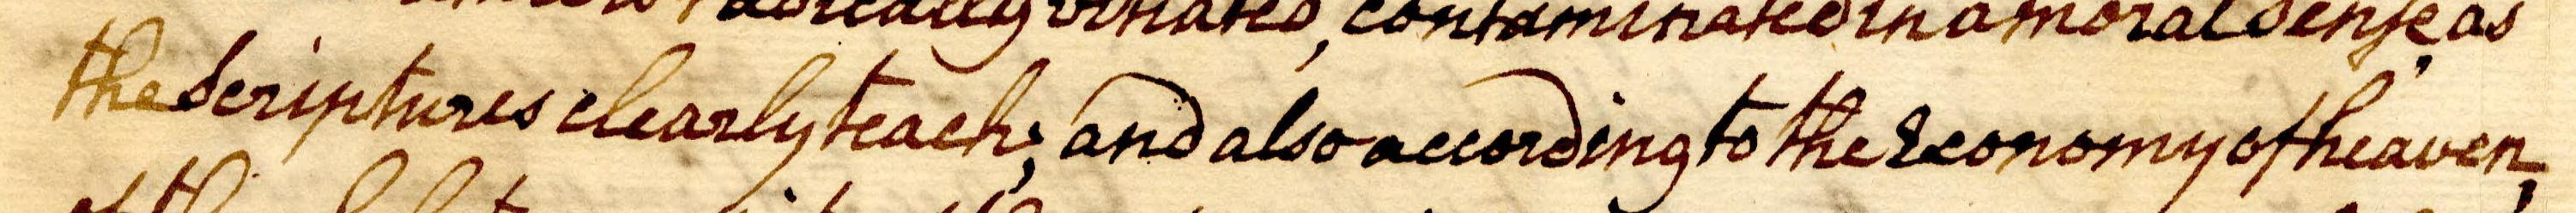The scriptures clearly teach; and also according to the Economy of heaven,
